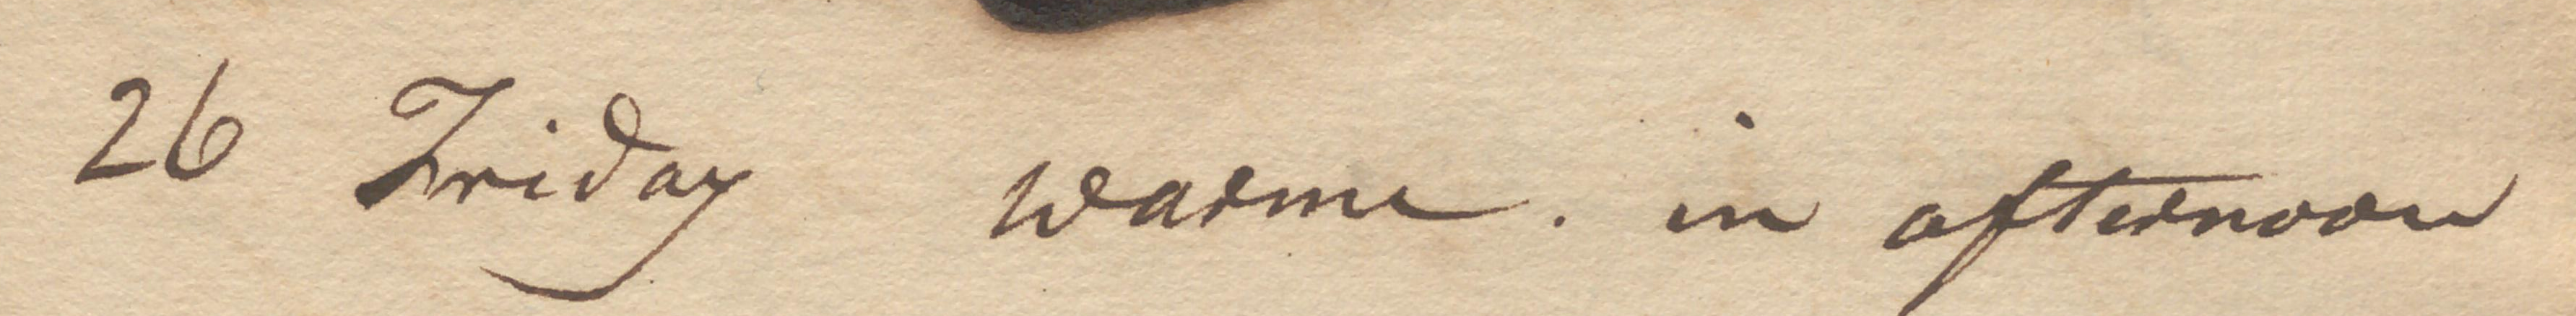26 Friday warme. in afternoon
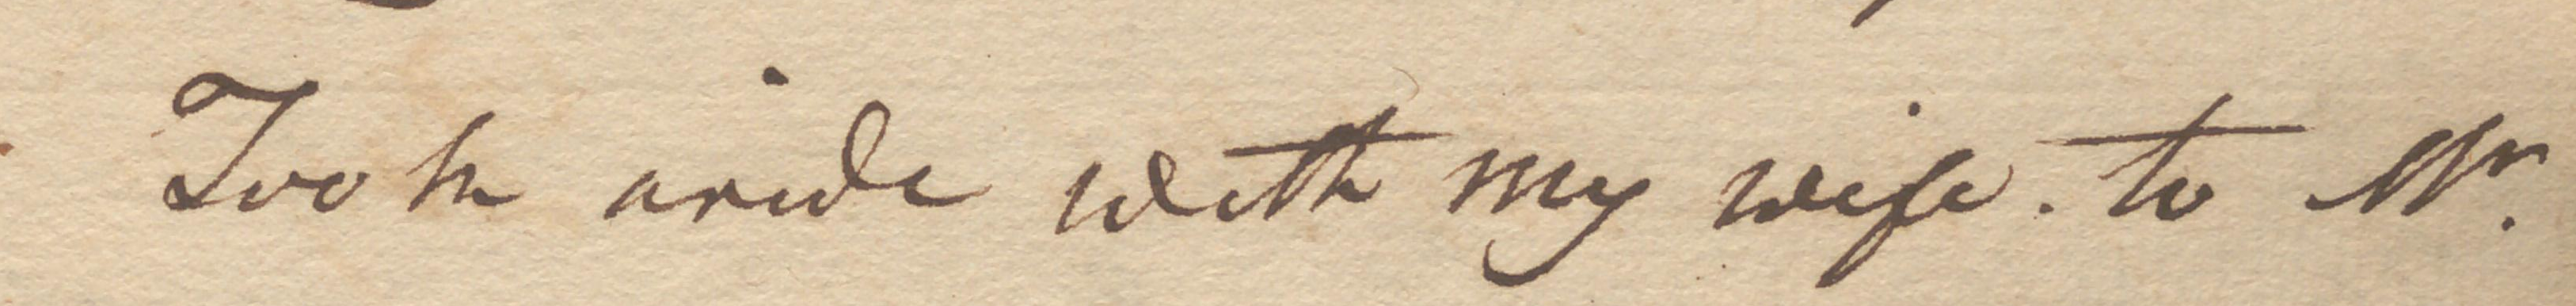Took a ride with my wife. to M^r.
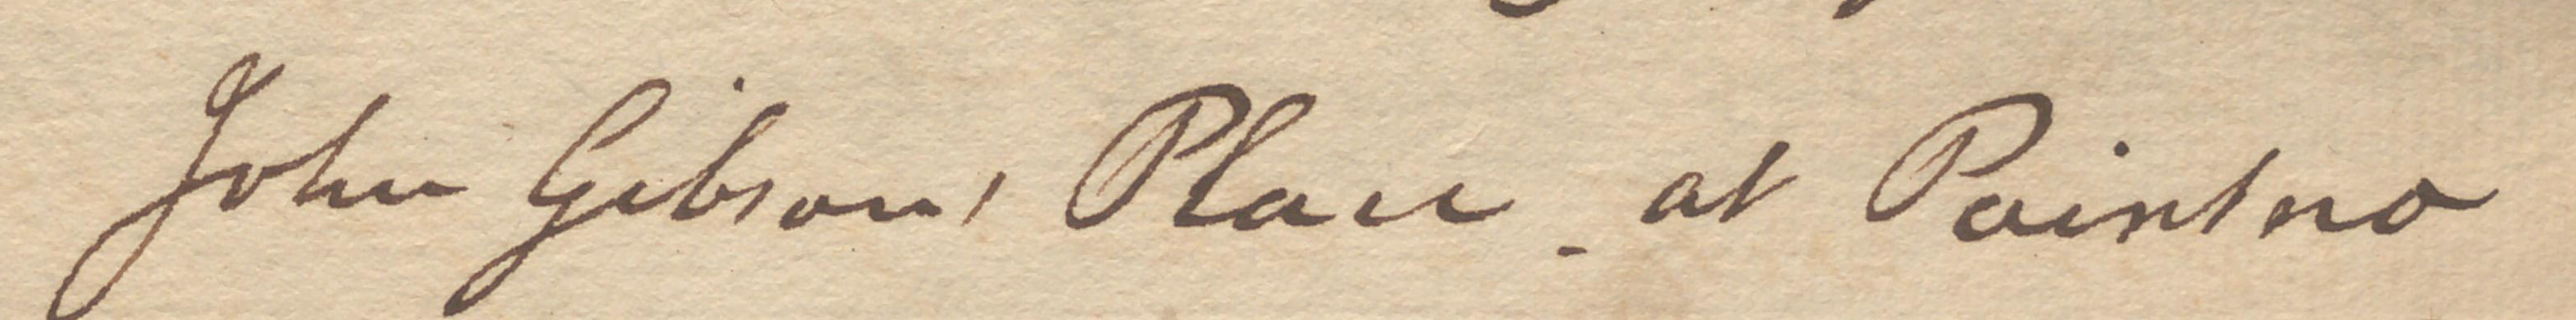John Gibsons Plan at Paintno
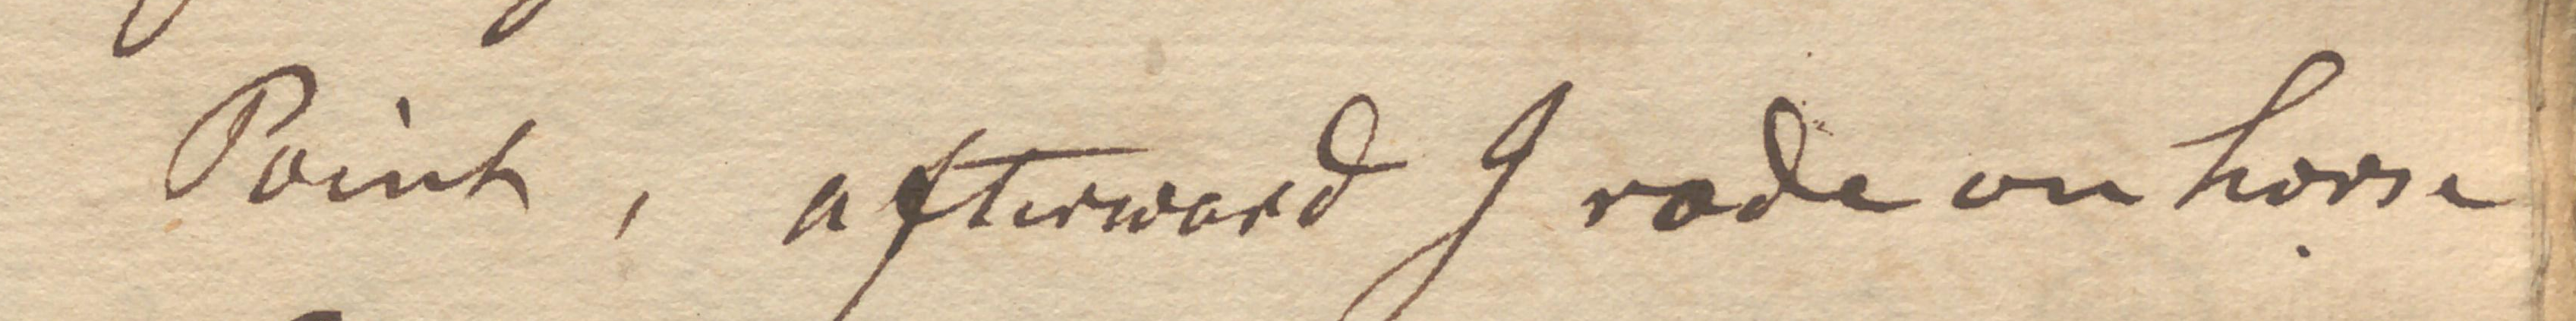Point, afterward I rode on horse
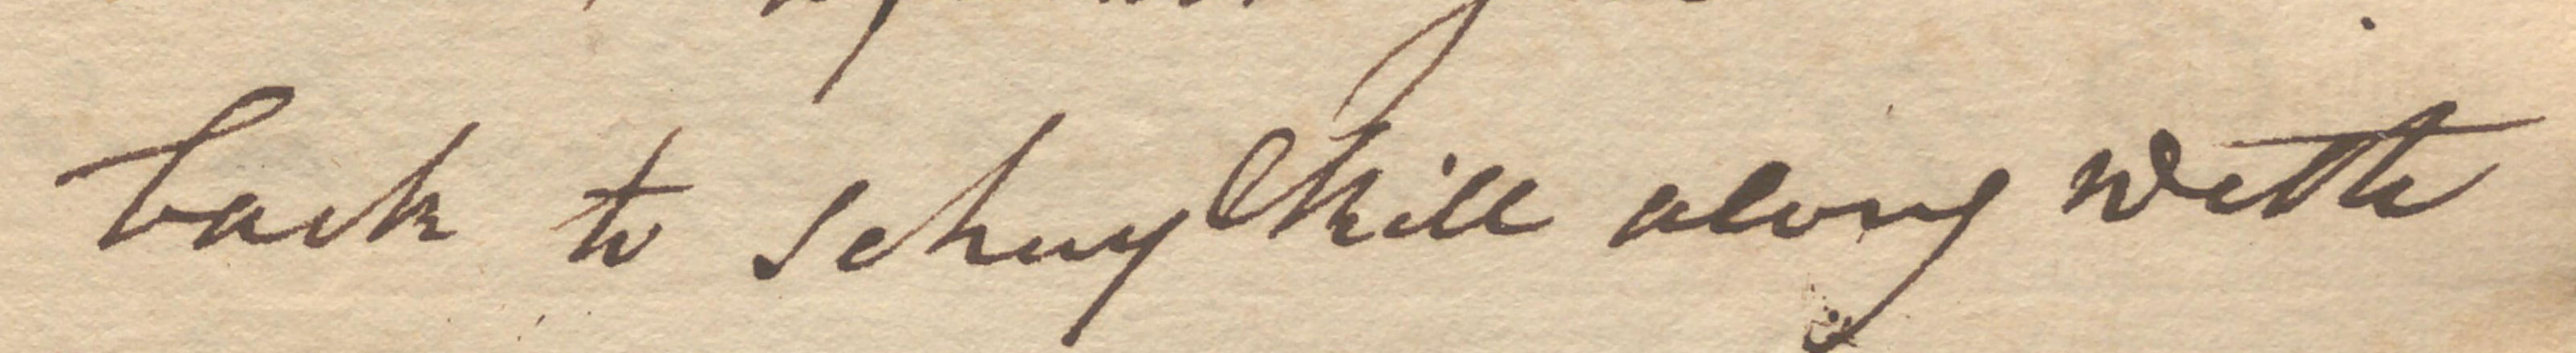back to schuylkill along with
